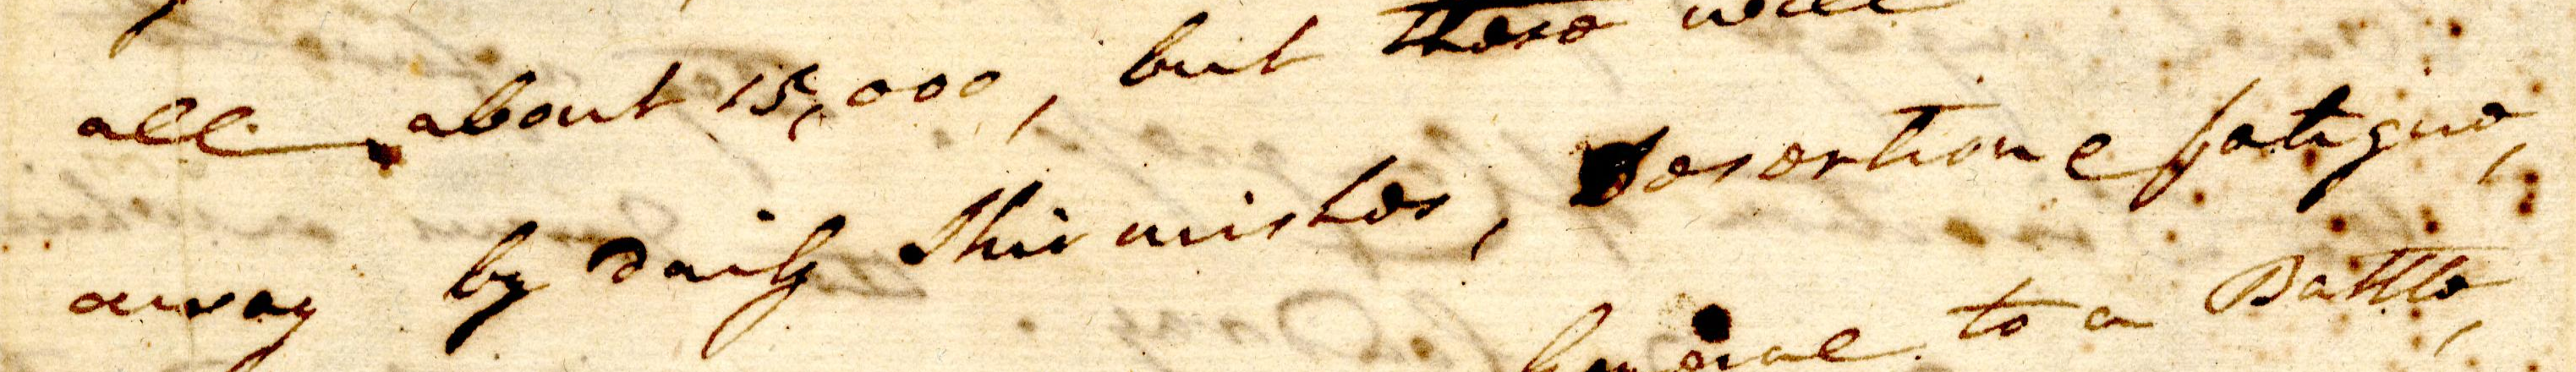away by daily skirmishes, Desertion & fatigue
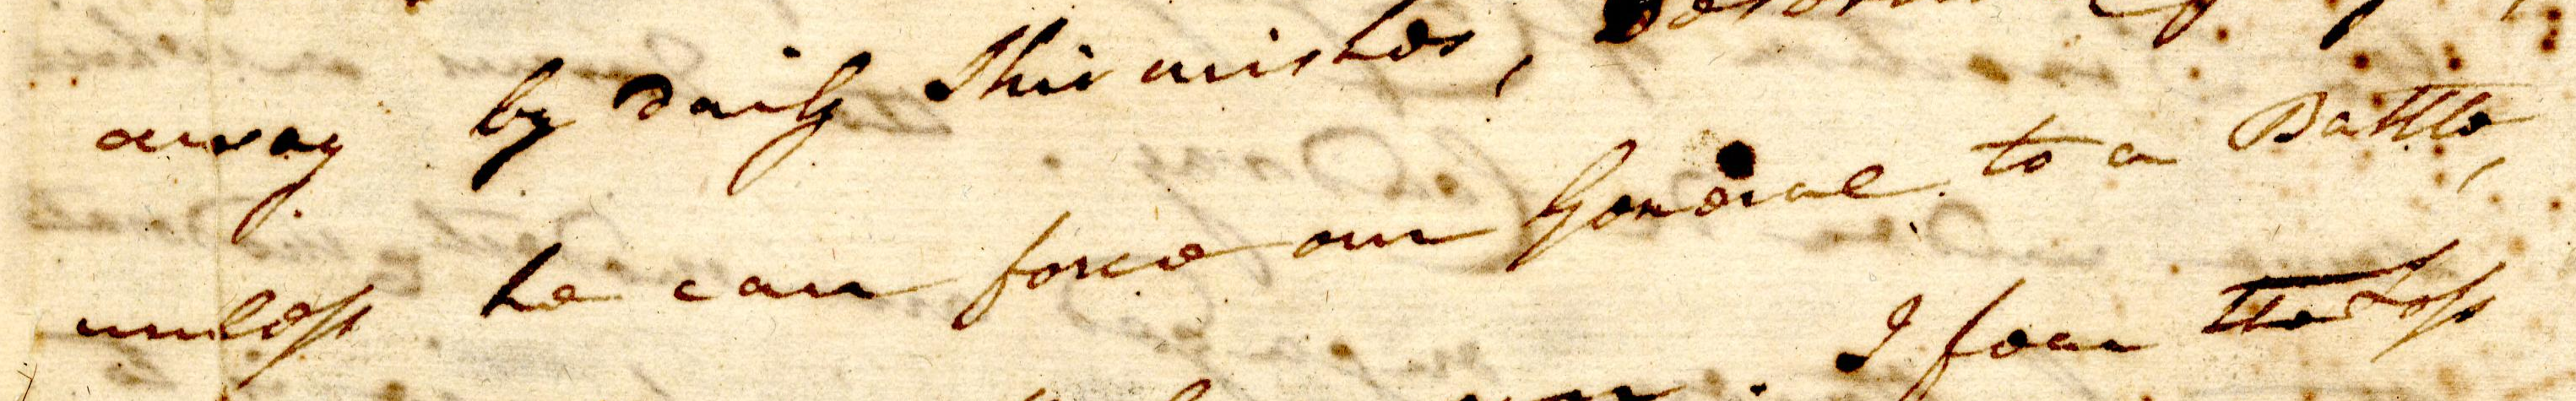unless he can force our General to a Battle
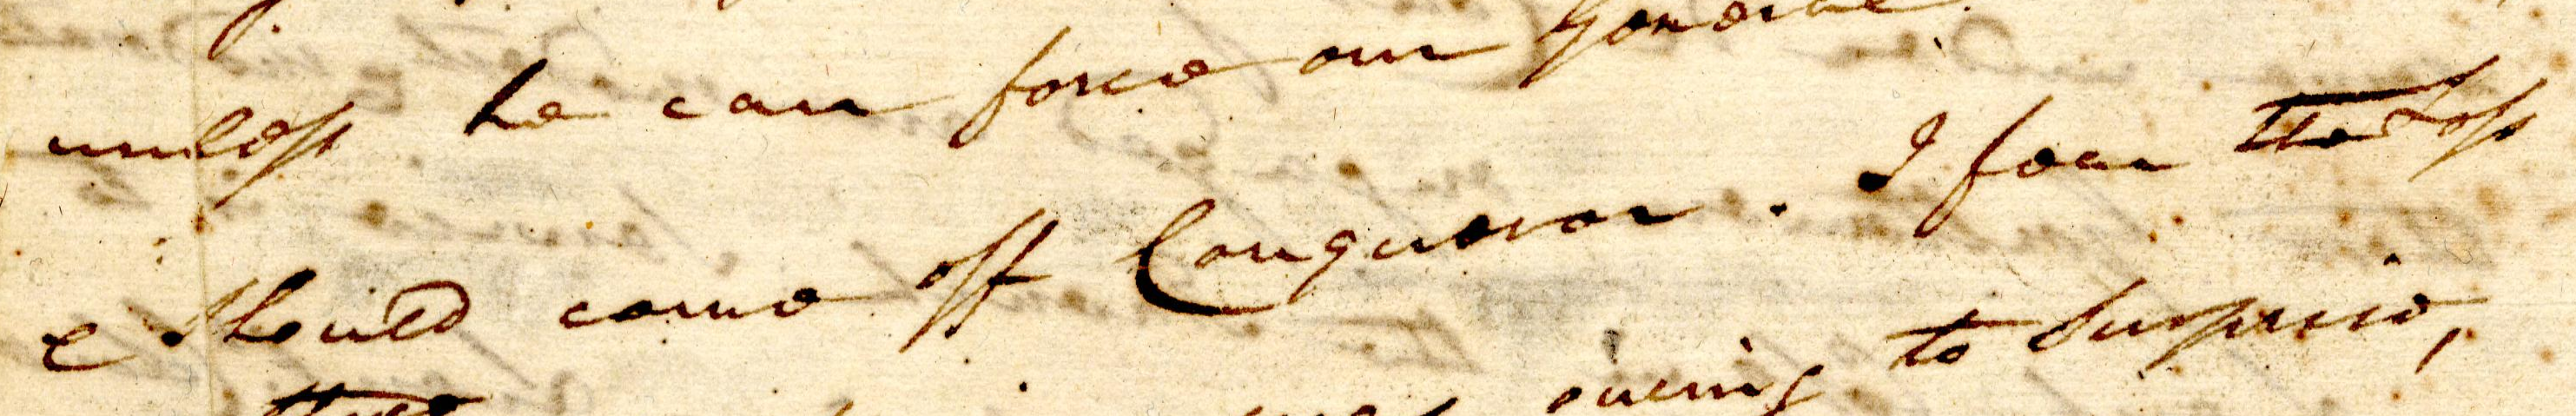& should come off Conqueror. I fear the Loss
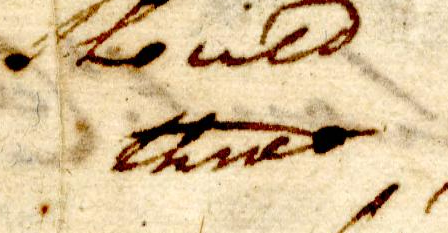three
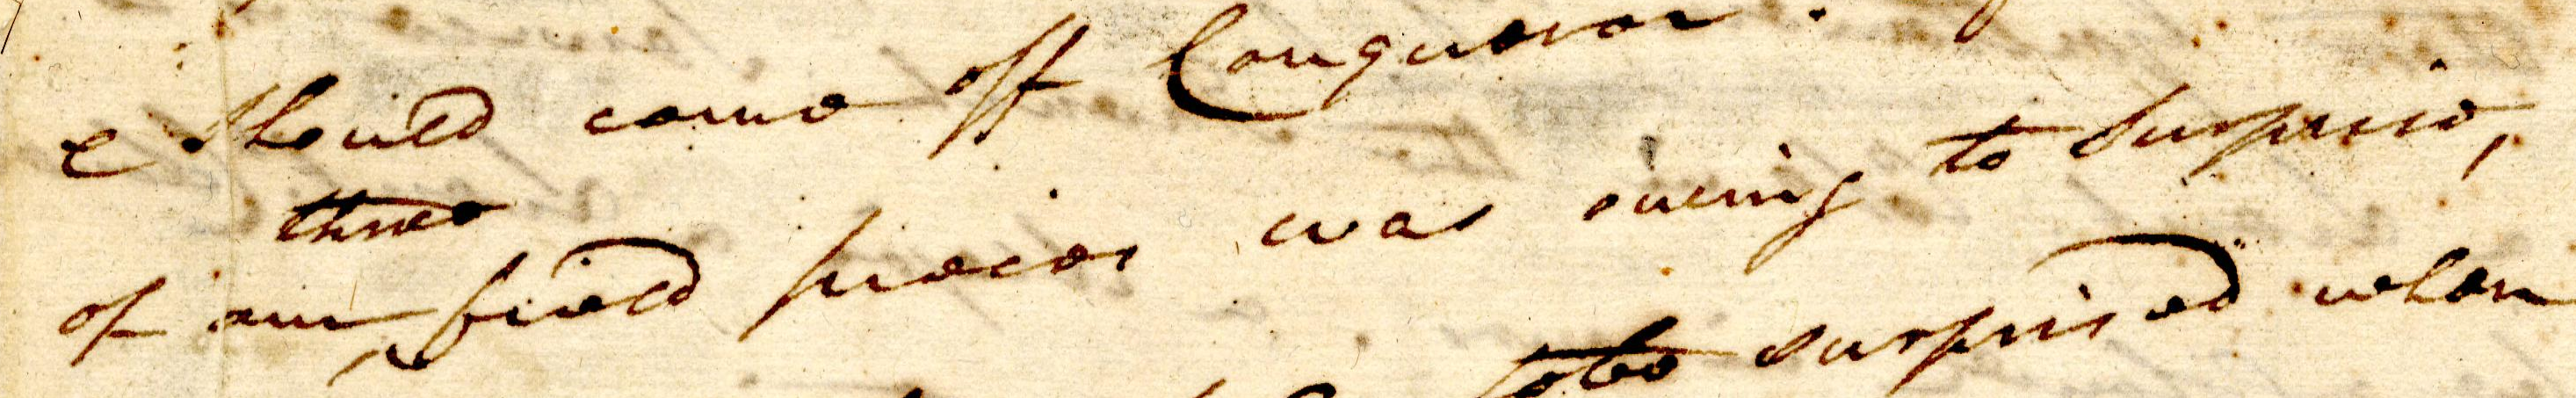of our field pieces was owing to surprise,
